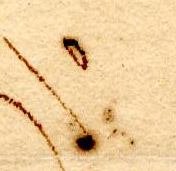To
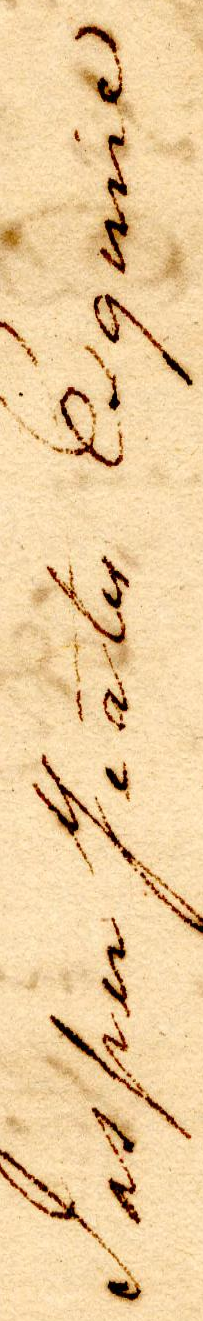Jasper Yeates Esquire
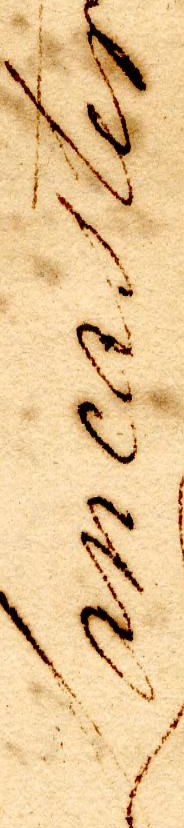Lancaster
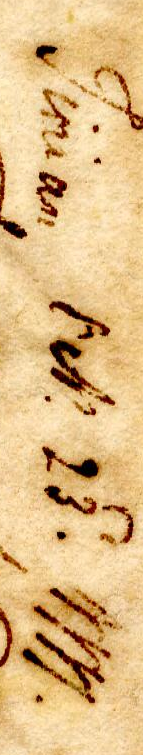Tinian Oct^r. 23^d. 1777.
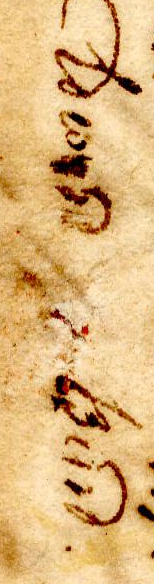Edward Burd.
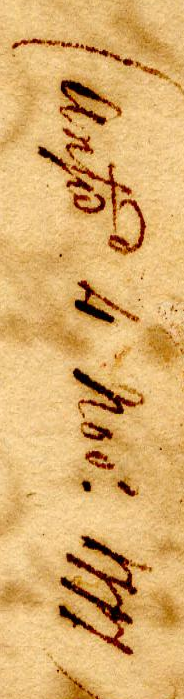(Answ^d 4 Nov^r. 1777)
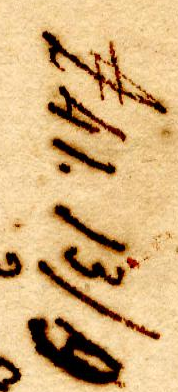£41. 13s9
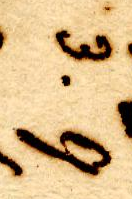3.9
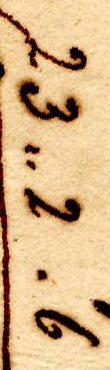23..2.6
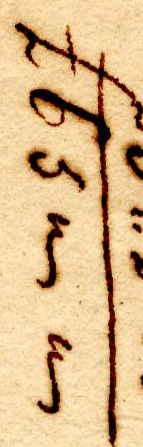£65- -
